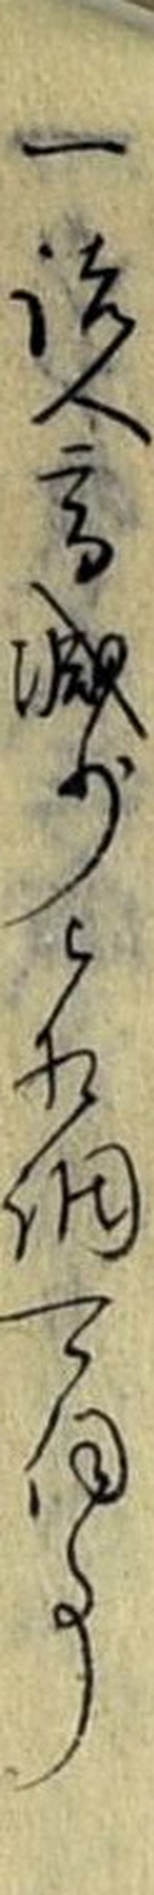一諸人高減少被相調可伺事
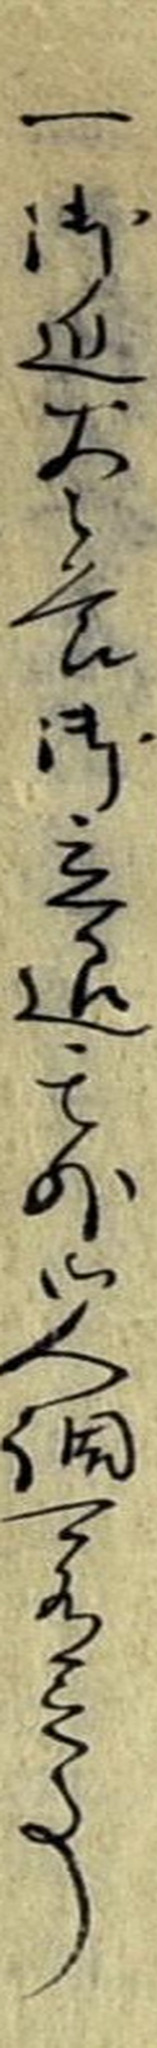一御近火之節御立退其外御人調可有之事
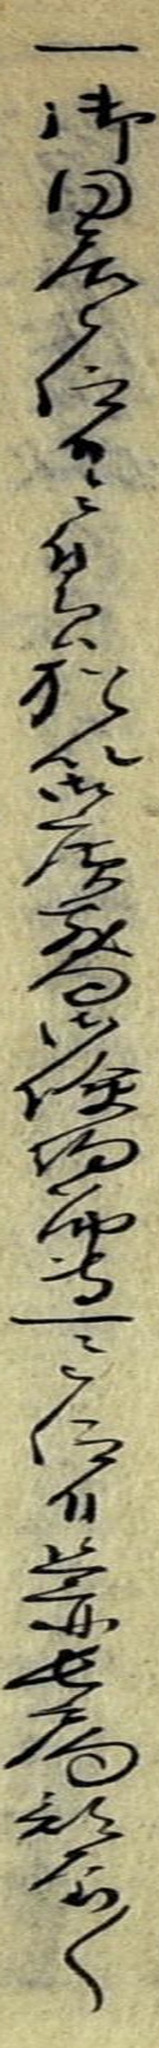一御同居被仰付候ニ付而ハ猶以御広敷向御倹約筋専一ニ被仰付且亦長局部屋〳〵
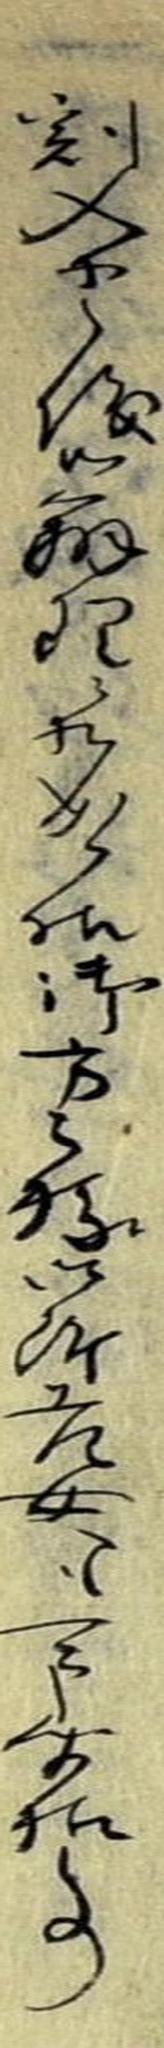割入等之儀御弁理ニ相成候様御方々様御付老女へも可申聞様事
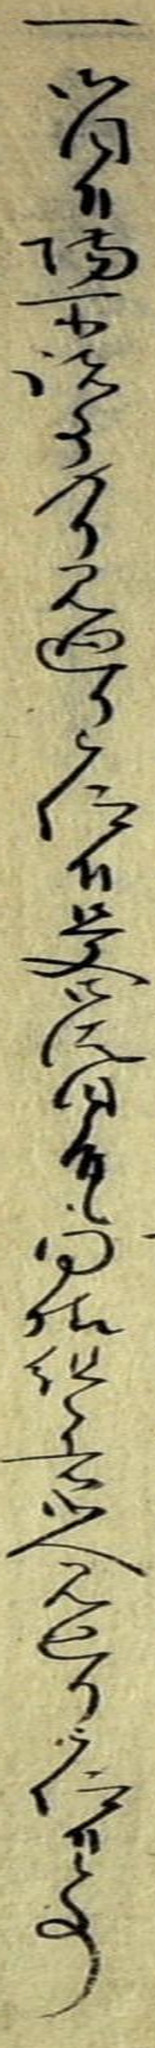一御目付場所諸事〆り見廻り被仰付且又御徒目付も同様組之者弐人見廻り被仰付候事
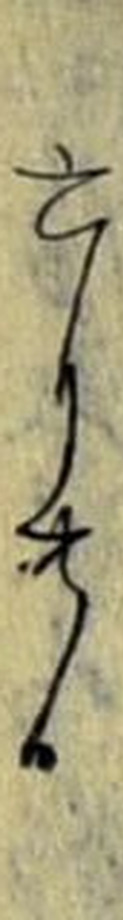六月廿日

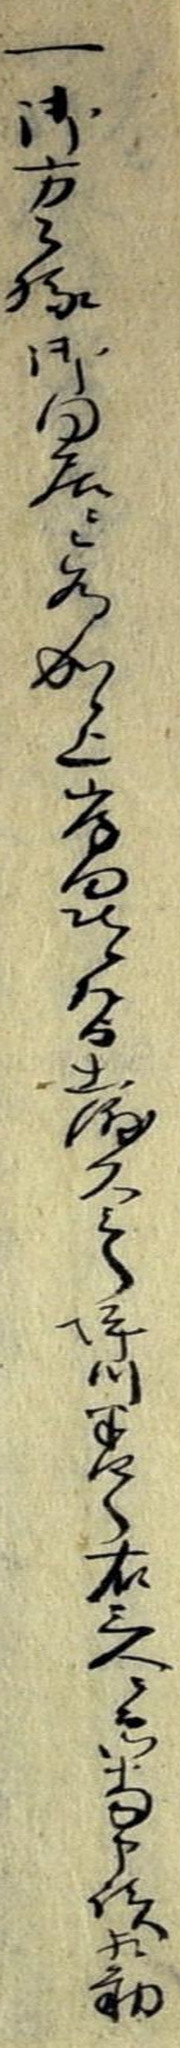一御方々様御同居ニ被為成候上岸田次郎左衛門出浦久三郎坪川半四郎右三人ニ而御番申談相勤
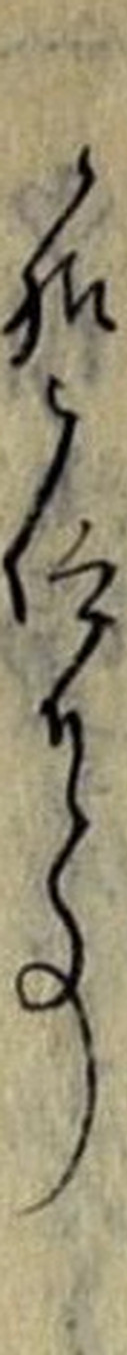候様被仰付候事
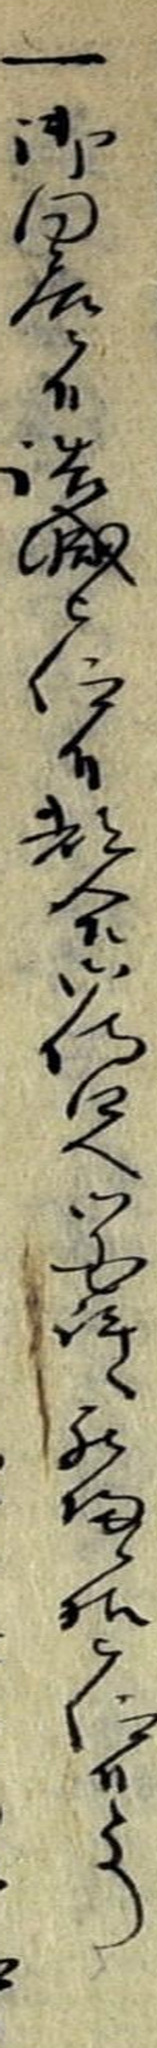一御同居ニ付詰減被仰付都合御侍四人御国許へ罷帰候様被仰付候事
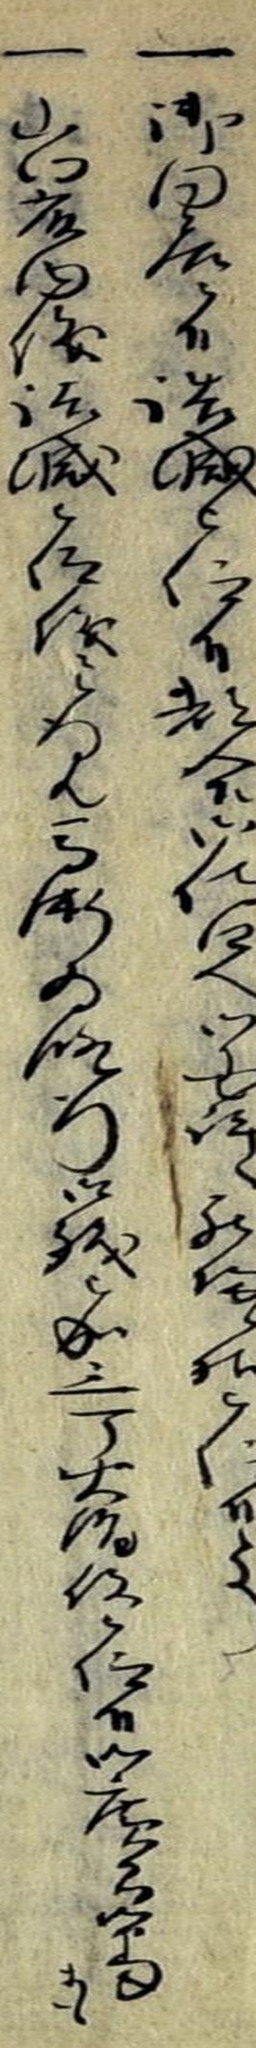一山口藤内儀詰減被仰儀ニ候得共馬術為修行御残被成三丁火消役被仰付御広間御番等も
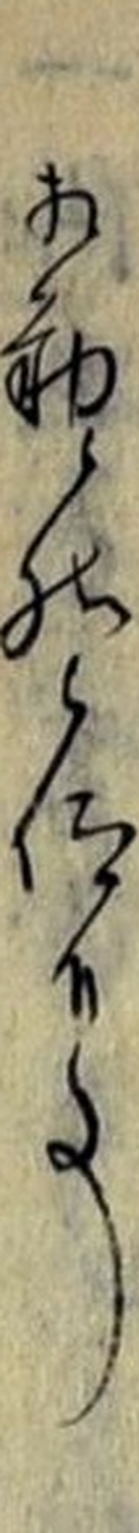相勤候様被仰付事
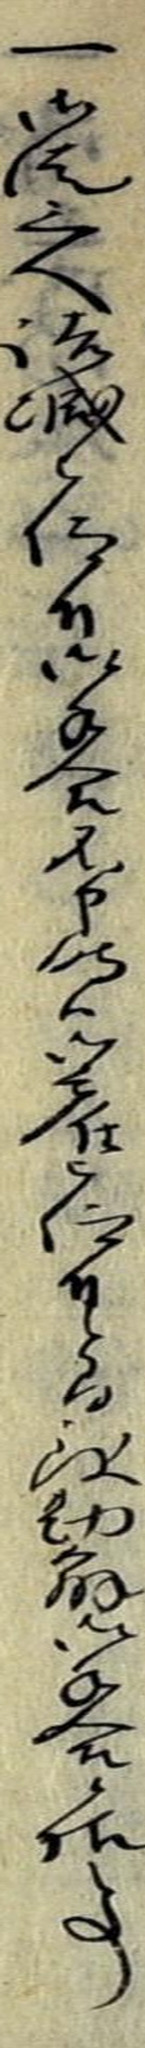一御徒三人詰減被仰付御手合不申時ハ御雇被仰付候間致勘弁御手合候様候事
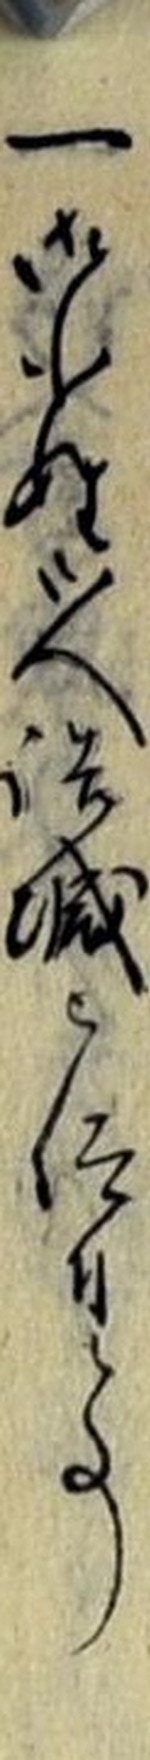一御小姓弐人詰減被仰付候事
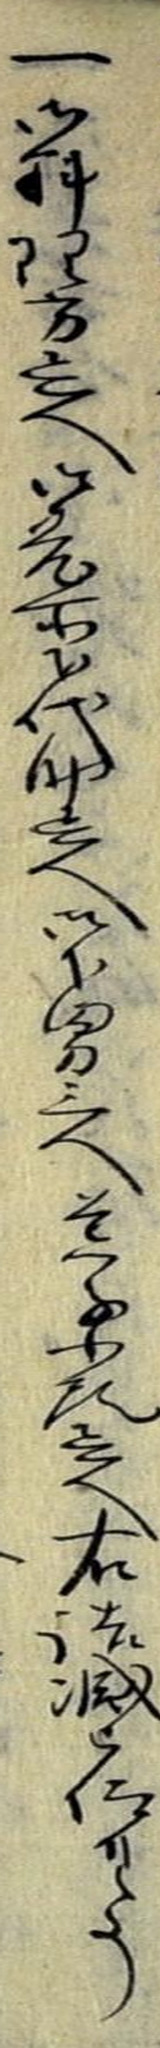一御料理方壱人御台所下代助壱人御下男三人荒子小頭壱人右詰減被仰付候事
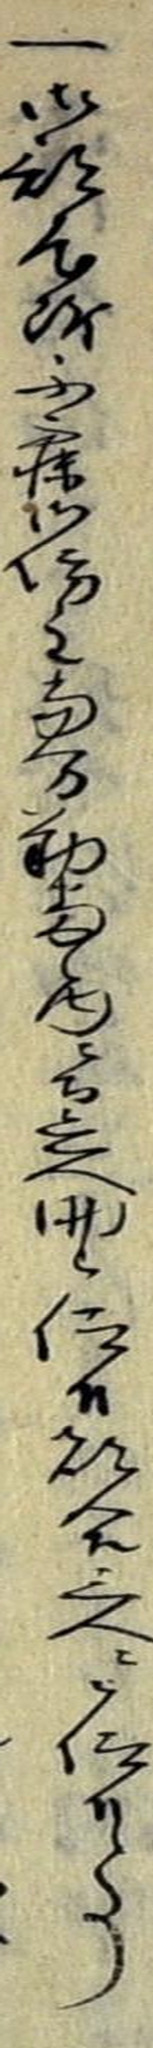一御部屋付不寝御坊主当分勤番之内ニ而壱人助被仰付都合三人ニ被仰付候事
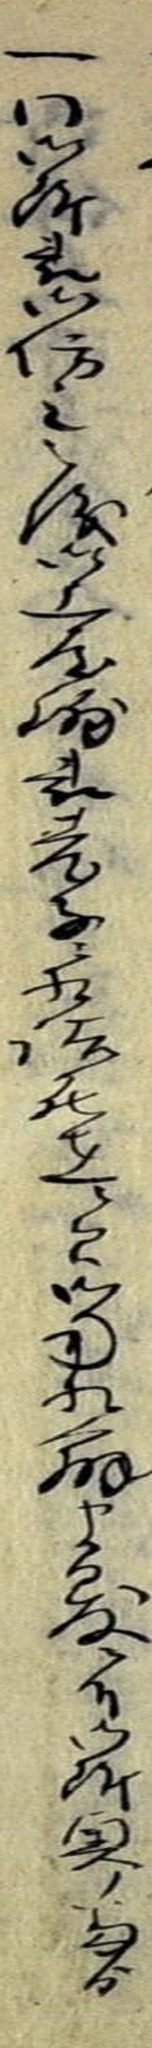一同御付表御坊主之儀御上屋鋪表台子ニ相詰罷在候而ハ御用相弁申間敷ニ付御付奥ノ番ゟ
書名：命令之部 三
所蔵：福井県文書館 Fukui Prefectural Archives
